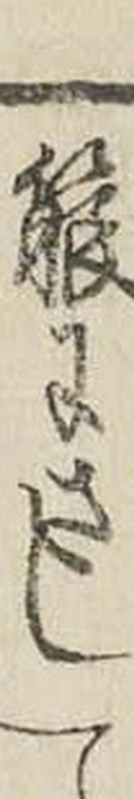箙にさし
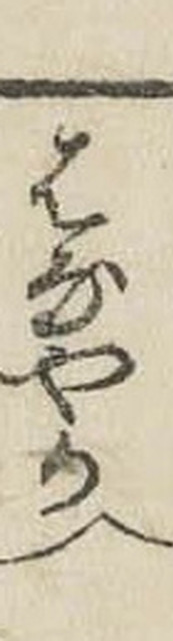はなやか
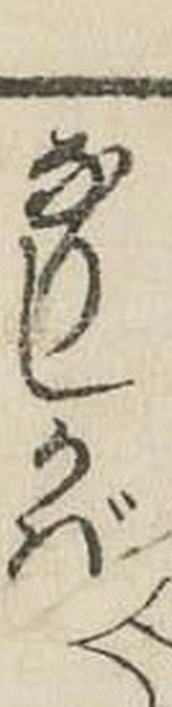なりしかば
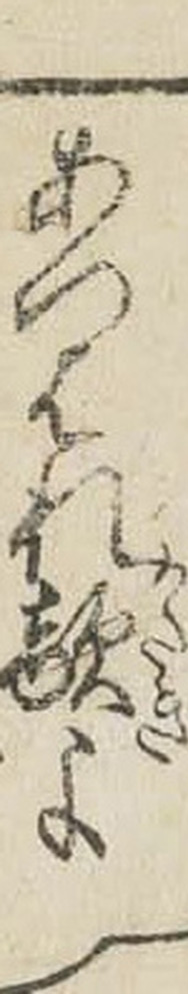あつはれ敵よ
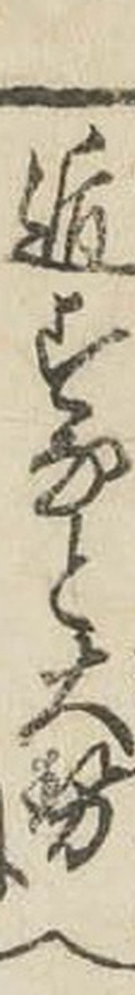遁すなと大勢
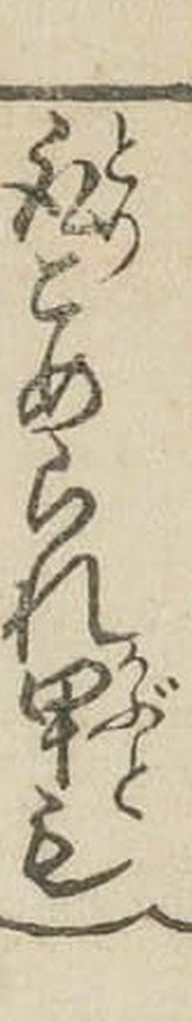取こめられ甲も
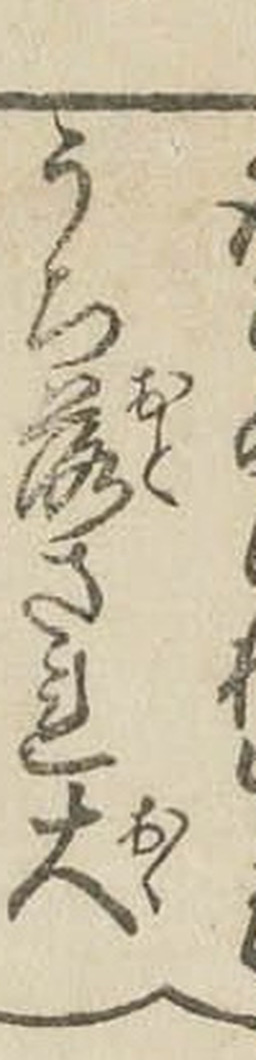うち落され大
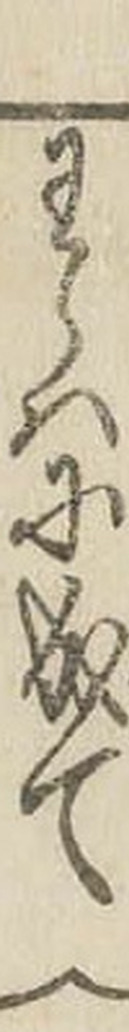わらはに成て
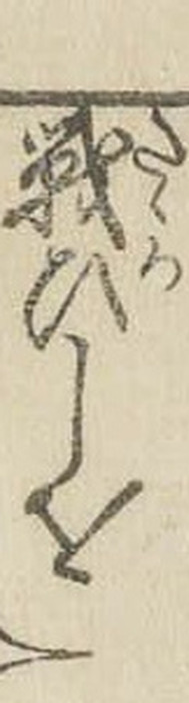戦ひしを
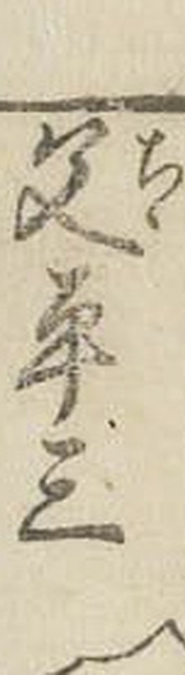父平三
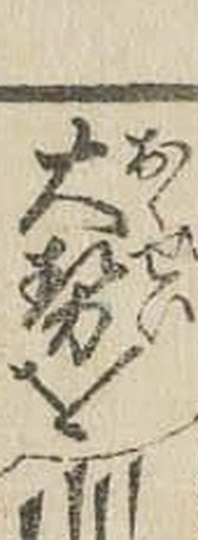大勢を
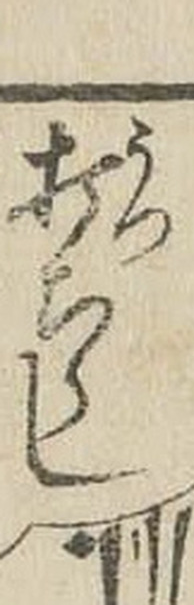打ちらし
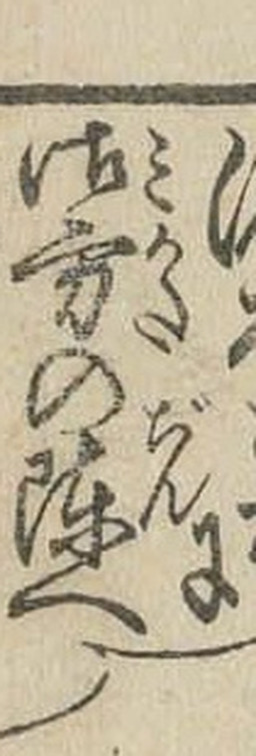御方の陣へ
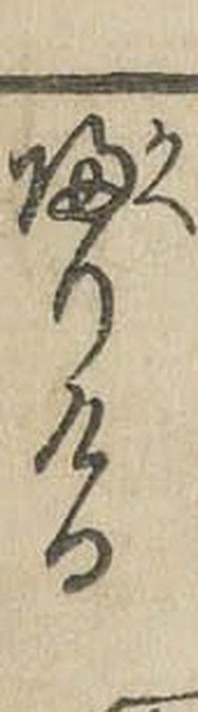帰りける

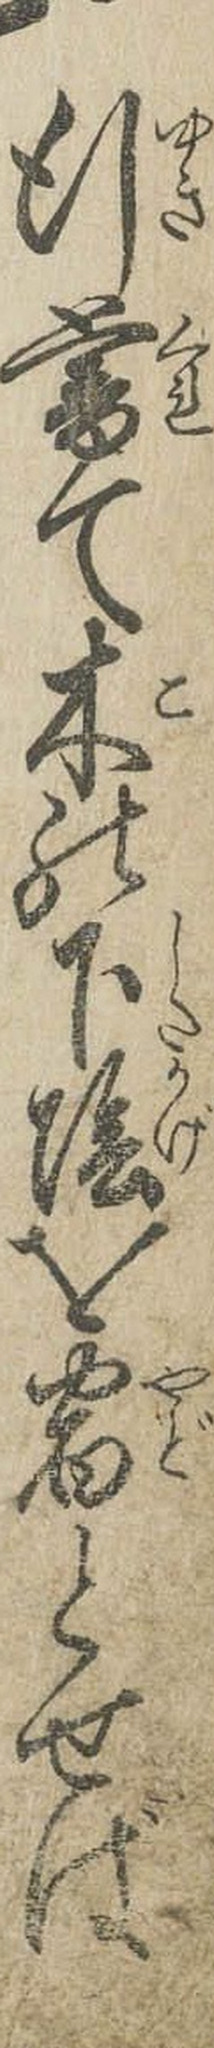行暮て木の下陰を宿とせば
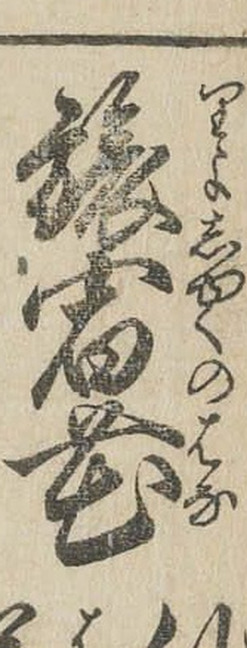旅宿花
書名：絵本写宝袋 9巻 3之巻
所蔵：東京学芸大学教育コンテンツアーカイブ
